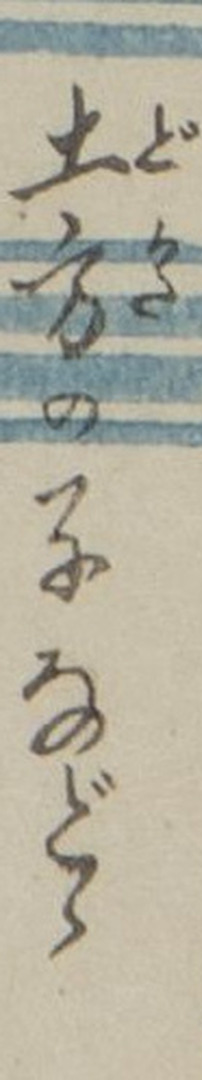土方の子などゝ
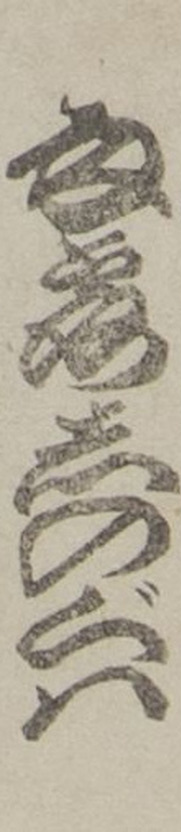雨露しのぐは
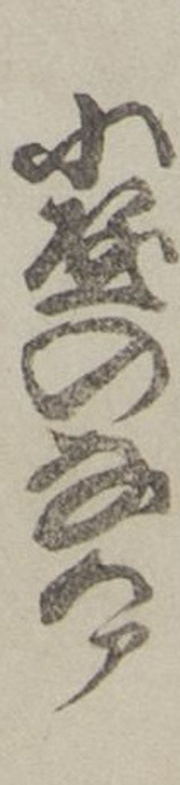小屋のなかァ
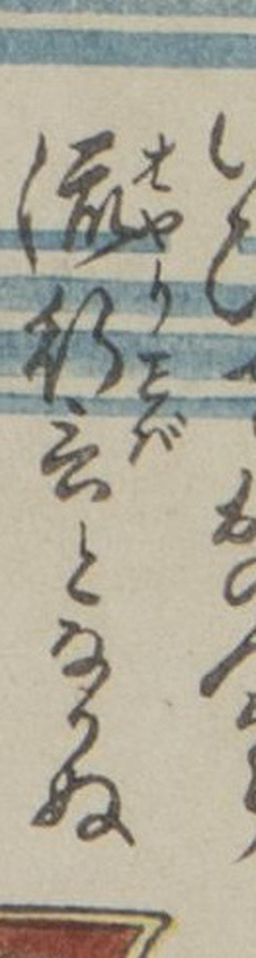流行言となりぬ
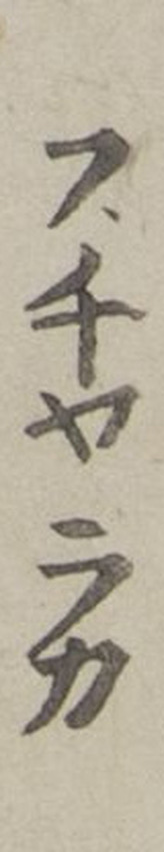フチヤラカ
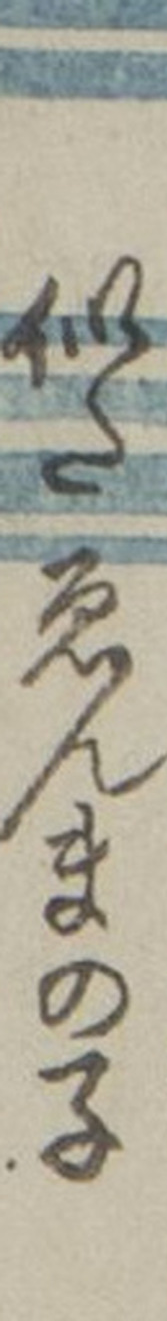似たゑんまの子
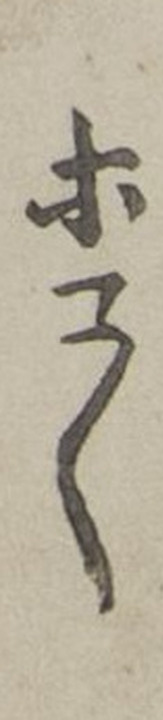ホヱ〳〵
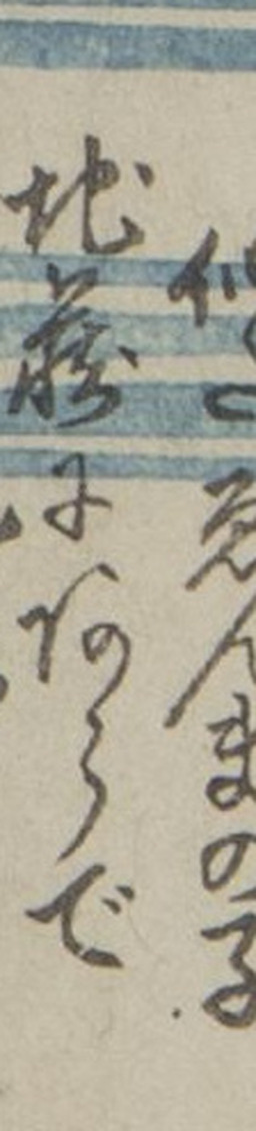地蔵にあらで
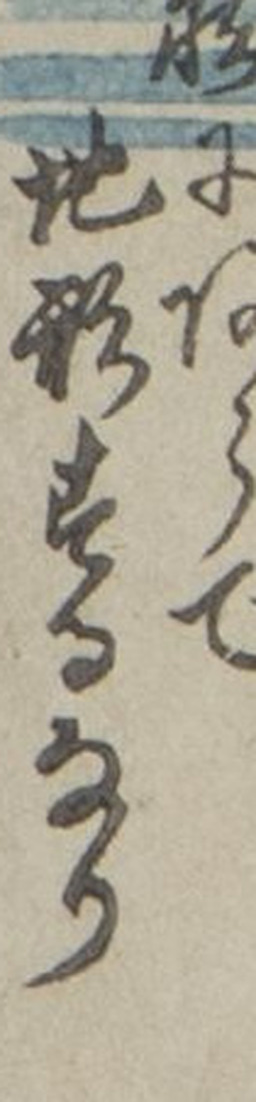地形するなり
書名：ゑんまの子のわけ
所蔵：あいおいニッセイ同和損保株式会社
